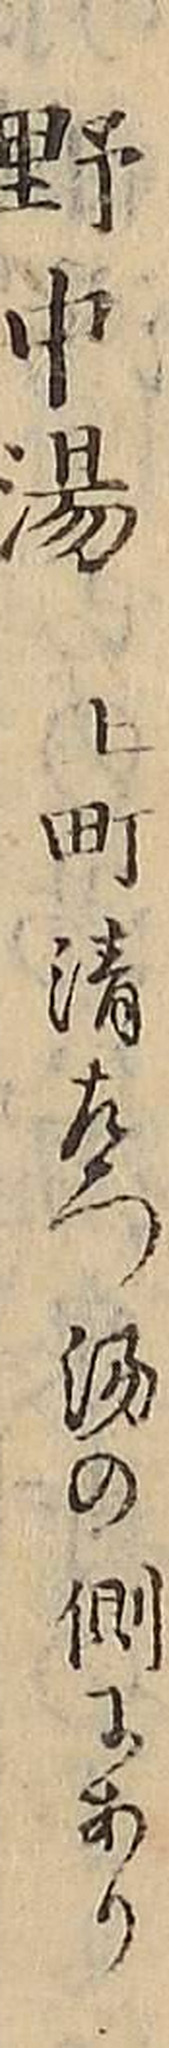野中湯上町清左門湯の側にあり
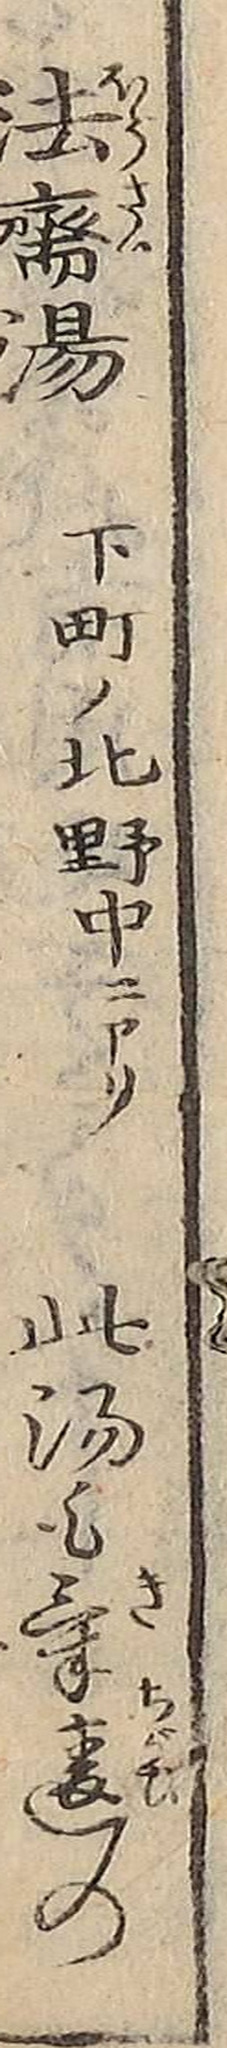法斎湯下町ノ北野中ニアリ此湯も気違の
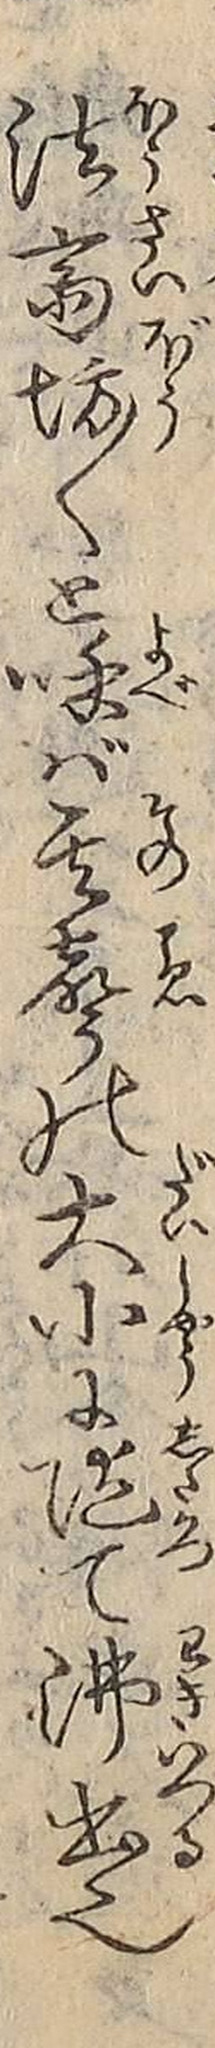法斎坊〳〵と呼ば其声の大小に随て沸出也
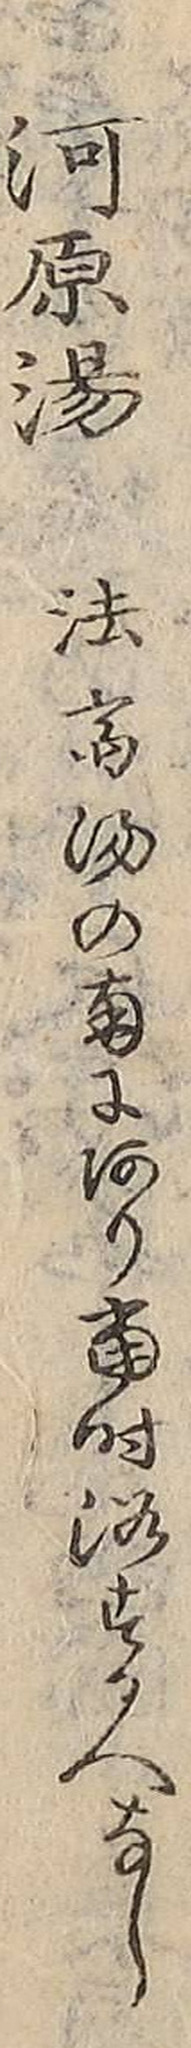河原湯法斎湯の南にあり当時湯する人なし
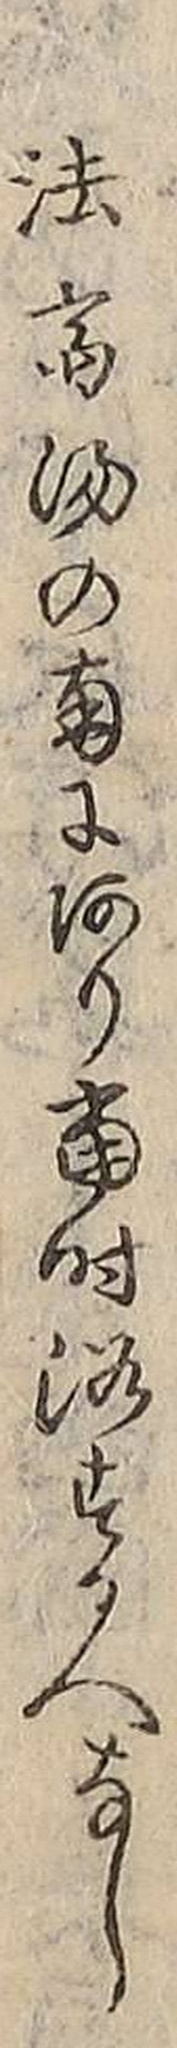河原湯法斎湯の南にあり当時湯する人なし
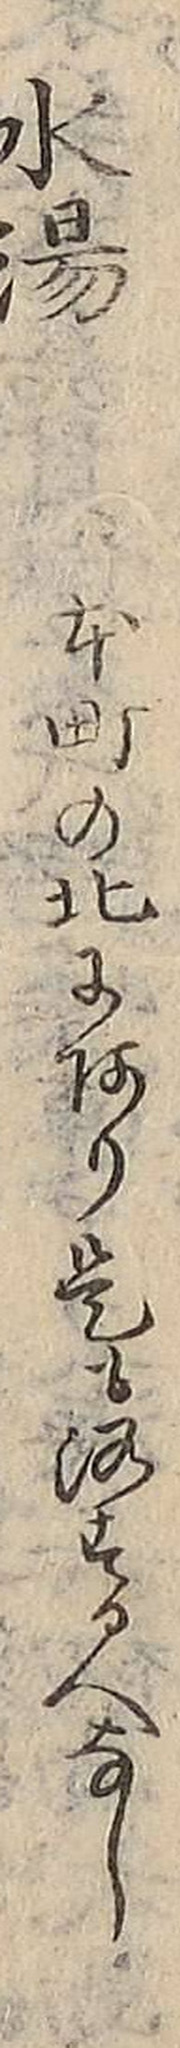水湯本町の北にあり是も湯する人なし
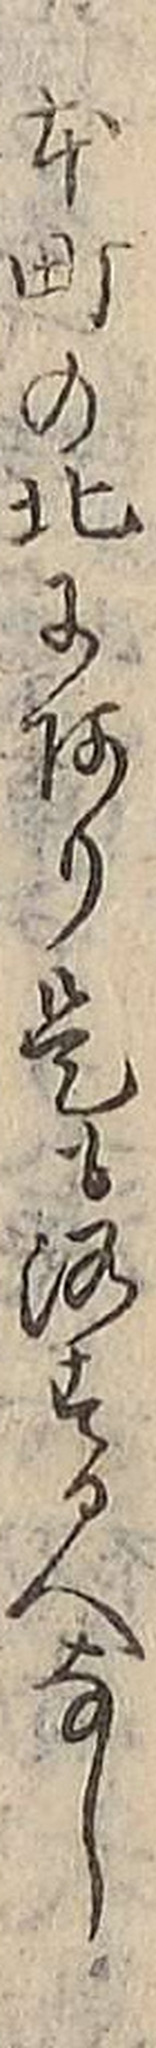水湯本町の北にあり是も湯する人なし
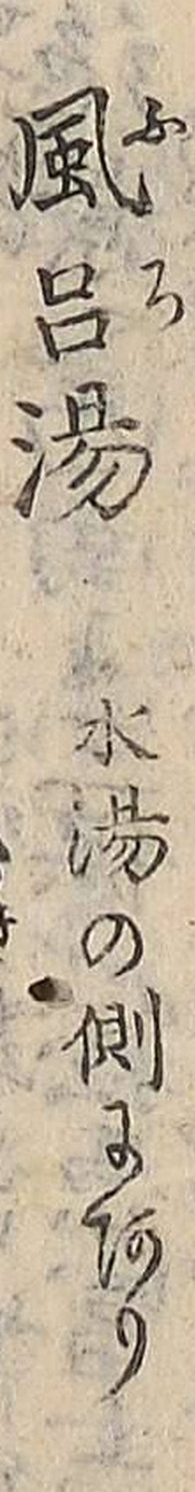風呂湯水湯の側にあり
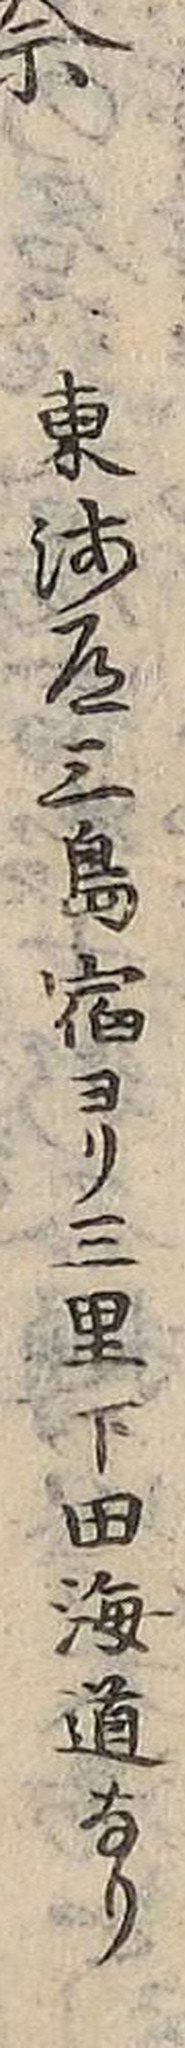小奈東海道三島宿ヨリ三里下田海道なり
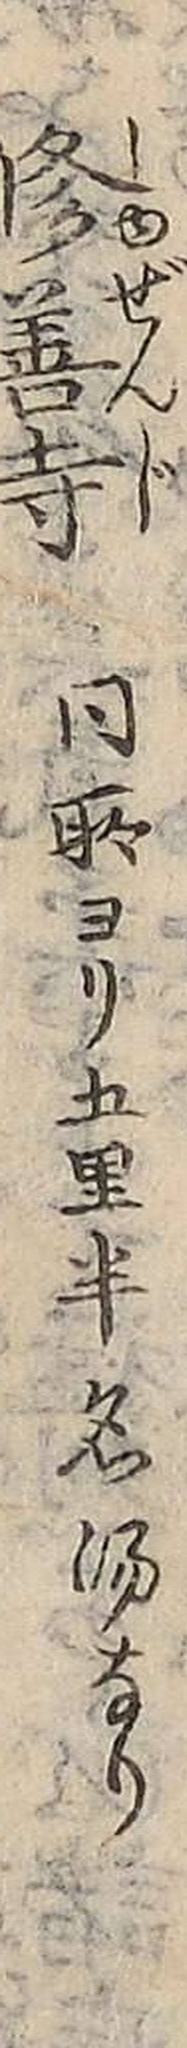修善寺同所ヨリ五里半名湯なり
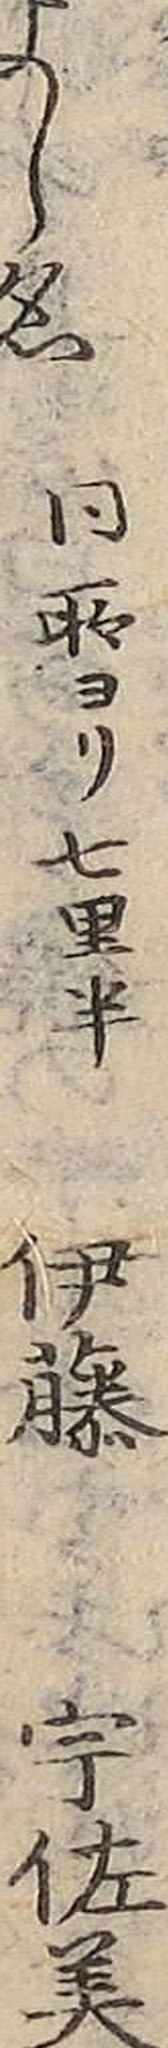よし名同所ヨリ七里半伊藤宇佐美
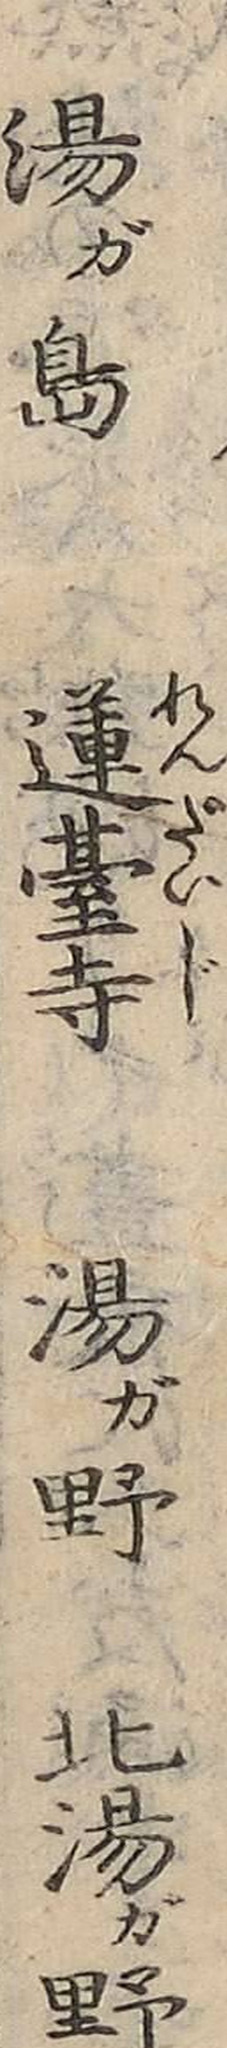湯ガ島蓮䑓寺湯野北湯野

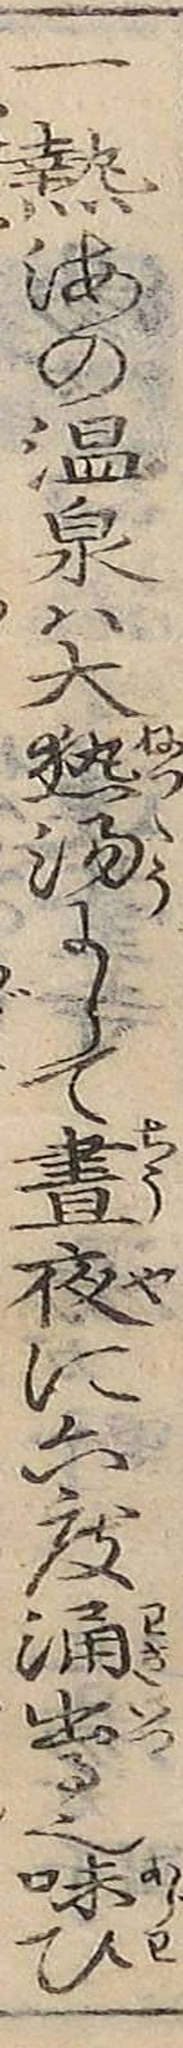一熱海の温泉は大熱湯にして昼夜に六度沸出る也味ひ
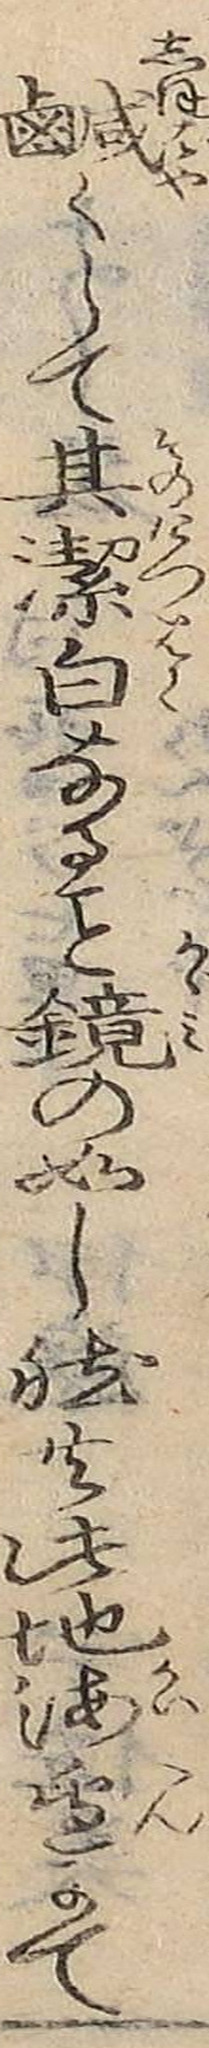鹹くして其潔白なること鏡の如し然共此地海辺にて
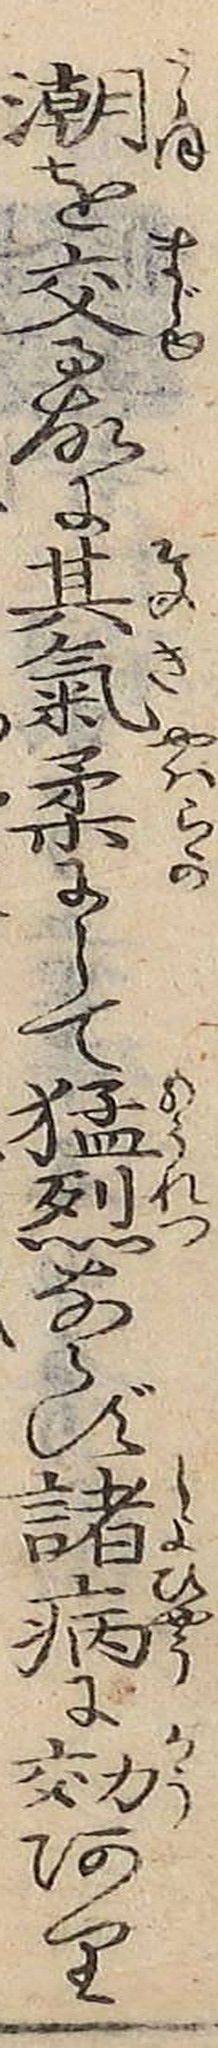潮を交る故に其気柔にして猛烈ならず諸病に効あり
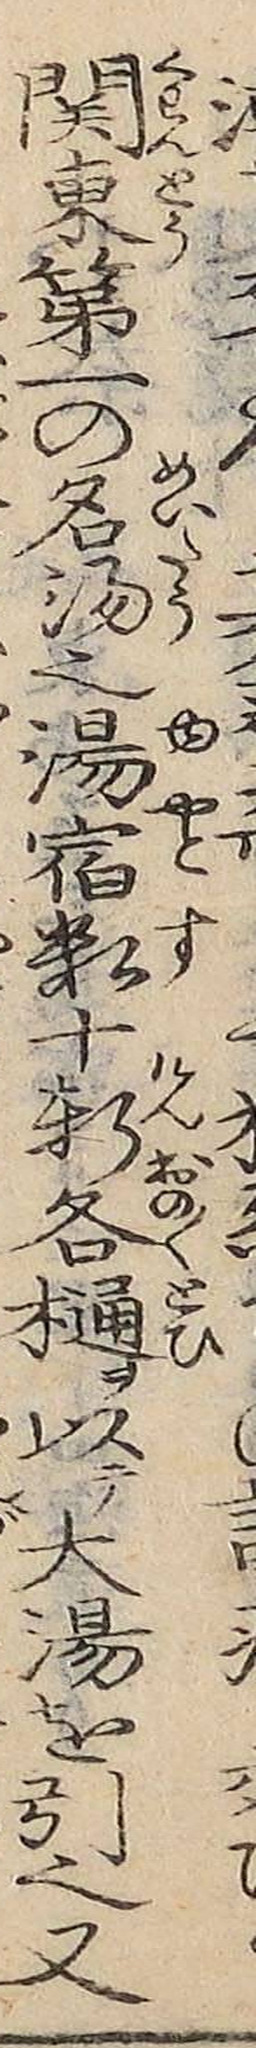関東第一の名湯也湯宿数十軒各樋以大湯を引也又
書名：旅行用心集
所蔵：神戸大学附属図書館 国文学研究資料館
